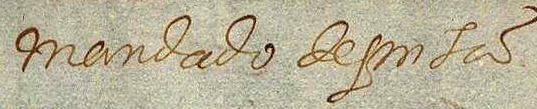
mandado de prisaõ
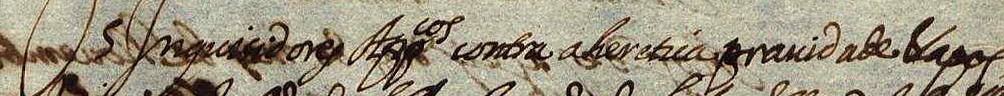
Os Jnquisidores Appcos contra a heretica prauidade & apos
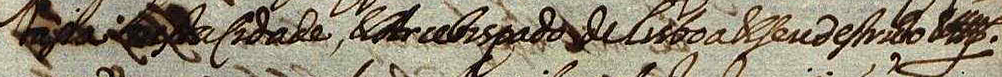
tasia nesta Cidade, & Arcebispado de Lisboa & seu destricto &tttꝭ.
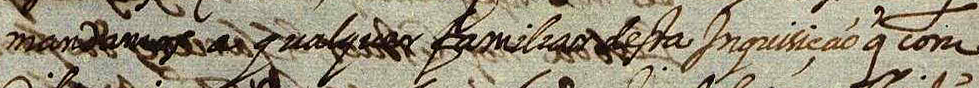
mandamos a qualquer familiar desta Jnquisiçaõ q̄ com
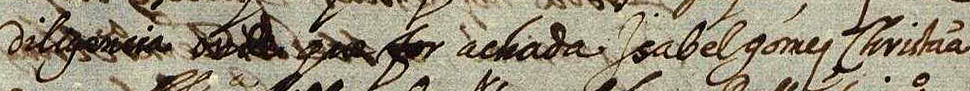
diligencia onde que for achada Jsabel gomez Christaā
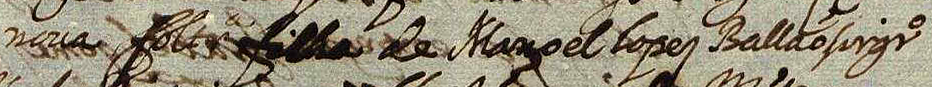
noua soltra filha de Manoel Lopez Ballaõ sirgro
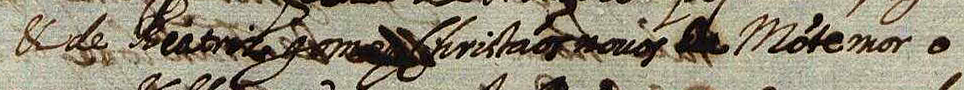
& de Beatriz gomez Christaõs nouos de Mōtemor o
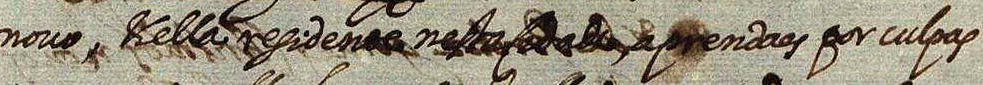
nouo, & ella residente nesta Cidade, a prendaes por culpas
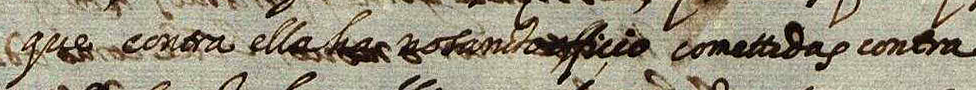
que contra ella ha no sancto officio comettidas contra
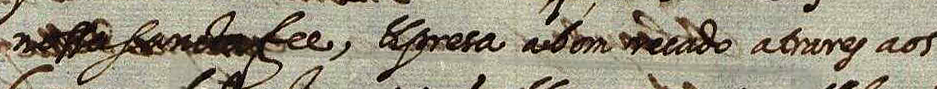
nossa sancta fee, & presa a bom recado a trares aos
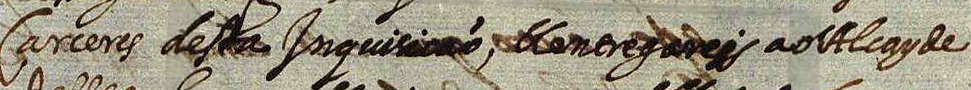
Carceres desta Jnquisiçaõ, & entregareis ao Alcayde
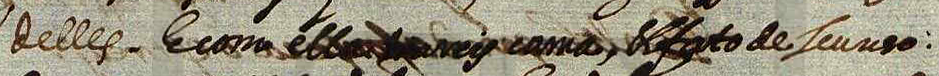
delles. E com ella trareis cama, & fato de seu uso:
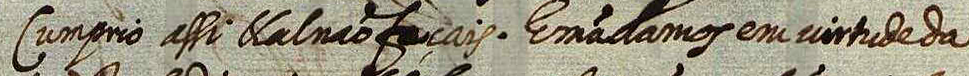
Cumprio assi & al naõ façais. E mādamos em uirtude da
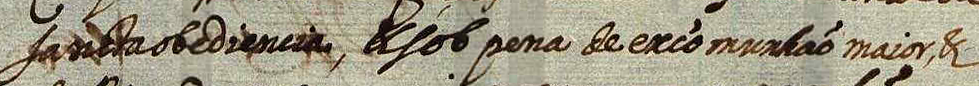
sancta obediencia, & sob pena de excōmunhaõ maior, &
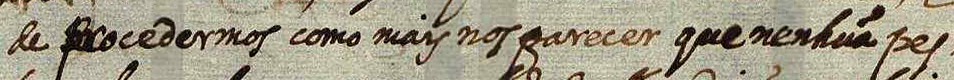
de procedermos como mais nos parecer que nenhuā pes
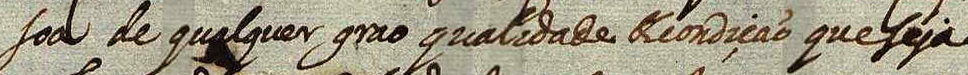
soa de qualquer grao qualidade & condiçaõ que seja
